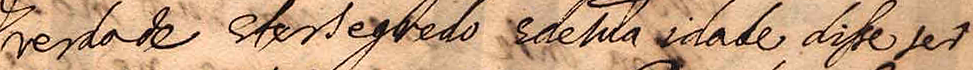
verdade E ter segredo E de sua idade, disse ser
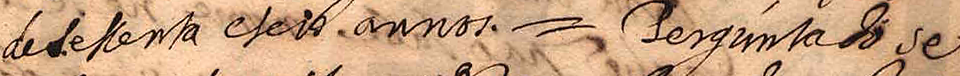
de sessenta e seis annos. = Perguntado se
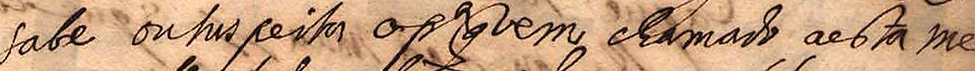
sabe ou suspeita o pa q̄ vem chamado a esta me
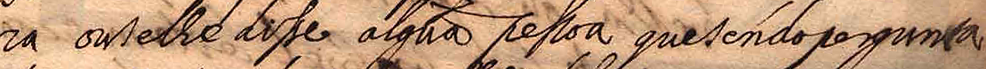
za ou se lhe disse alguā pessoa que sendo pergunta
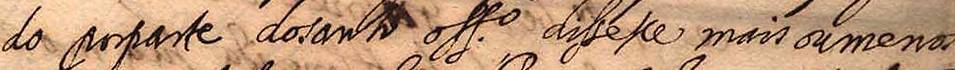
do por parte do santo off.o dissesse mais ou menos
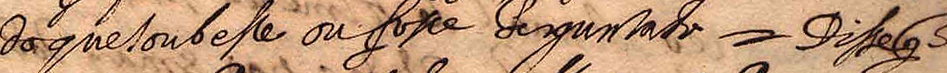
do que soubesse ou fosse Perguntado = Disse q̄
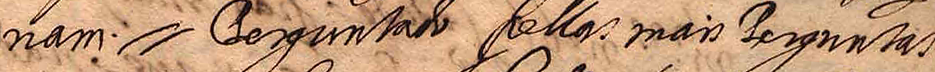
nam. = Perguntado pellas mais Perguntas
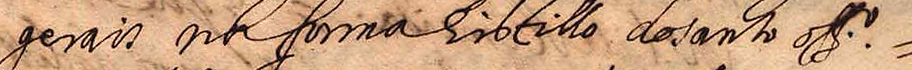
gerais na forma E istillo do santo off.o. =
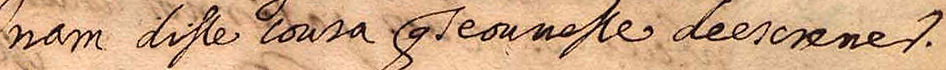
nam disse couza q̄ se ouuesse de escreuer.
